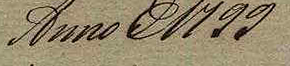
Anno d̄1799
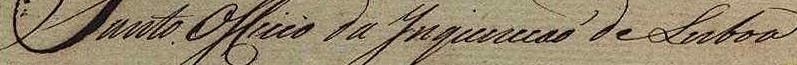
Santo Officio da Jnquisicaõ de Lisboa
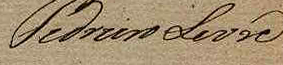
Pedreiro Livre
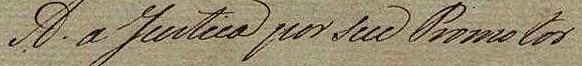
A. a Justica por seu Promotor
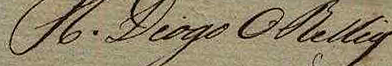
R. Diogo ORelley
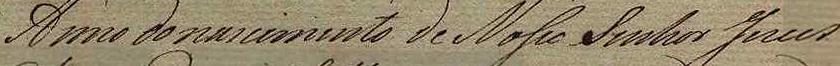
Anno do nascimento de Nosso Senhor Jezus
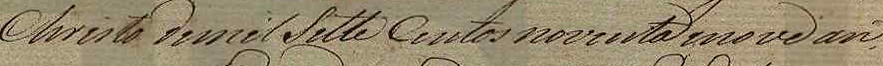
Christo de mil SetteCentos noventa e nove an,
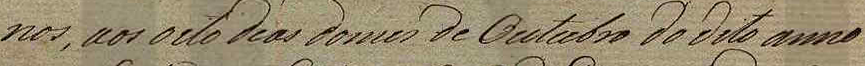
nos, aos oito dias do mes de Outubro do dito anno
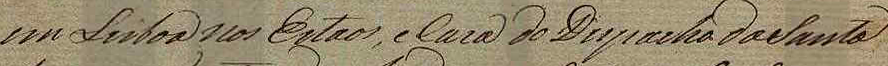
em Lisboa nos Estaos, e Caza do Dispacho da Santa
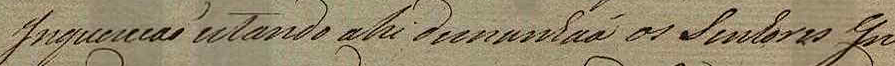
Jnquisicaõ estando ahi de manhaã os Senhores Jn,
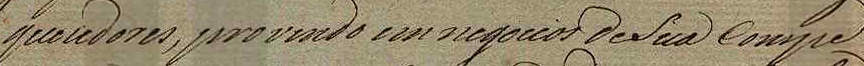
quisidores, provendo em negocios de Sua Compe
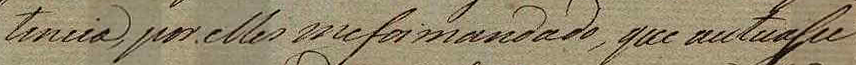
tencia, por elles me foi mandado, que autuasse
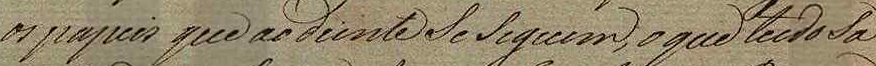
os papeis que ao diante Se Seguem, o que tudo Sa
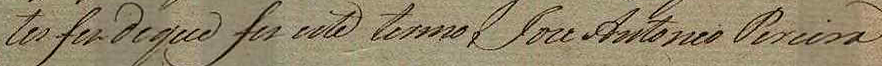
tesfez de que fez este termo Joze Antonio Pereira
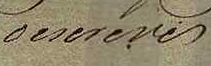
o escrevi
